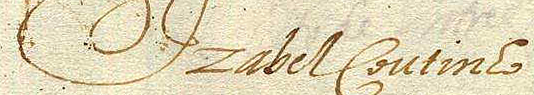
Jzabel Coutinho
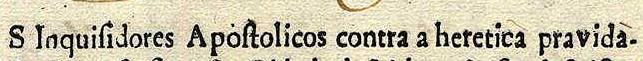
S Inquisidores Apostolicos contra a heretica pravida
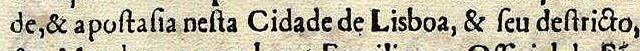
de, & apostasia nesta Cidade de Lisboa, & seu destricto
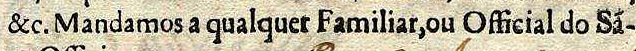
&c. Mandamos a qualquer Familiar, ou Official do Sā
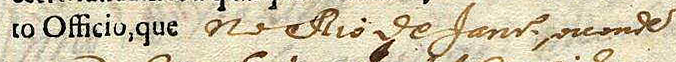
to Officio, que no Rio de Janr.o ou onde
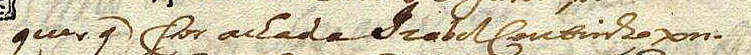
quer q̄ for achada Izabel Coutinho, xn
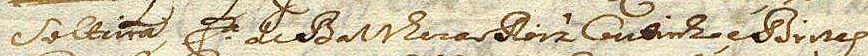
Solteira f.a de Balthezar Roiz̄ Coutinho, e Brites
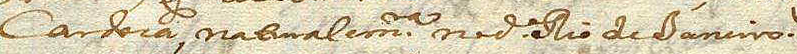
Cardoza, natural e m.ra no d.o Rio de Ianeiro.
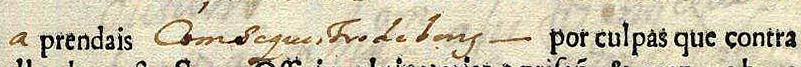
a prendais Com sequestro de bens - por culpas que contra
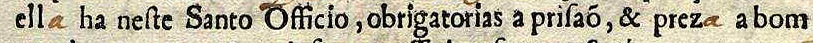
ella ha neste Santo Officio, obrigatorias a prisaõ, & preza a bom
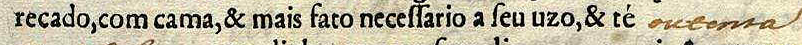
recado, com cama, & mais fato necessario a seu uzo, & té outenta
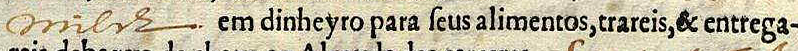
mil rs em dinheyro para seus alimentos, trareis, & entrega
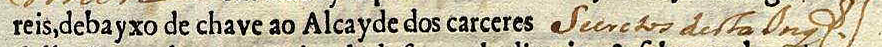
reis, debayxo de chave ao Alcayde dos carceres Secretos desta Inq.aõ
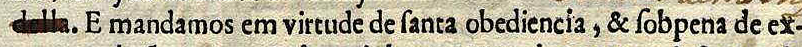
della E mandamos em virtude de santa obediencia, & sob pena de ex
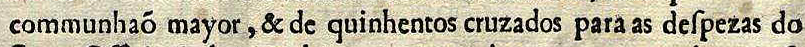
communhaõ mayor, & de quinhentos cruzados para as despezas do
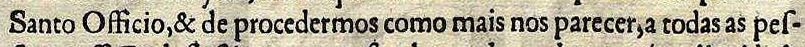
Santo Officio, & de procedermos como mais nos parecer, a todas as pes
